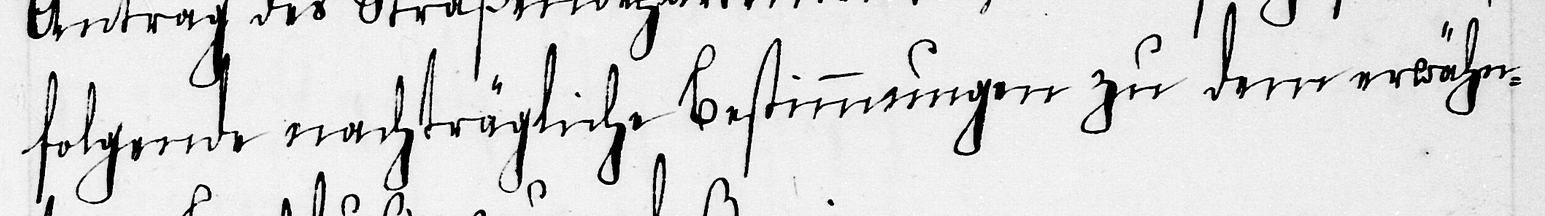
folgende nachträgliche Bestimmungen zu dem erwähn¬
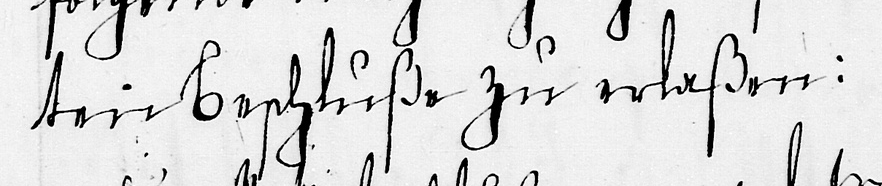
ten Beschluße zu erlaßen:
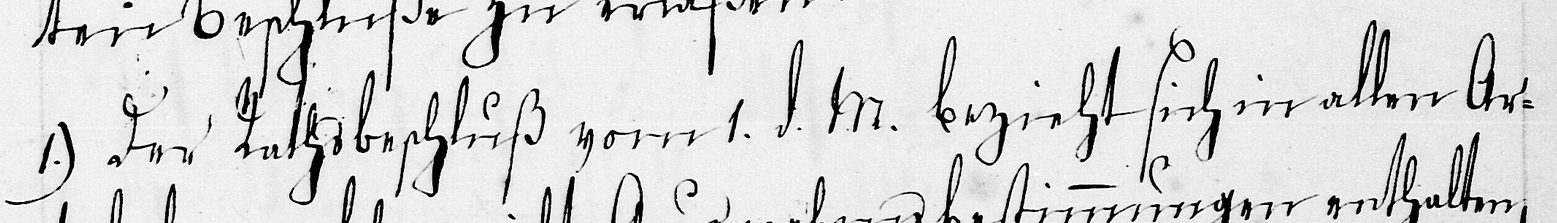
1.) Der Rathsbeschluß vom 1. d. M. bezieht sich in allen Ar¬
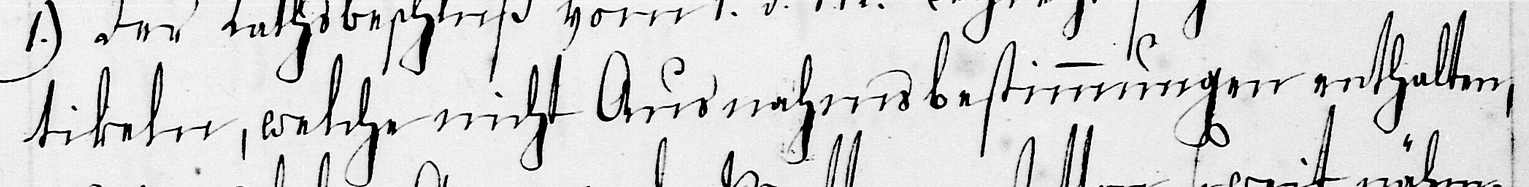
tikeln, welche nicht Ausnahmsbestimmungen enthalten,
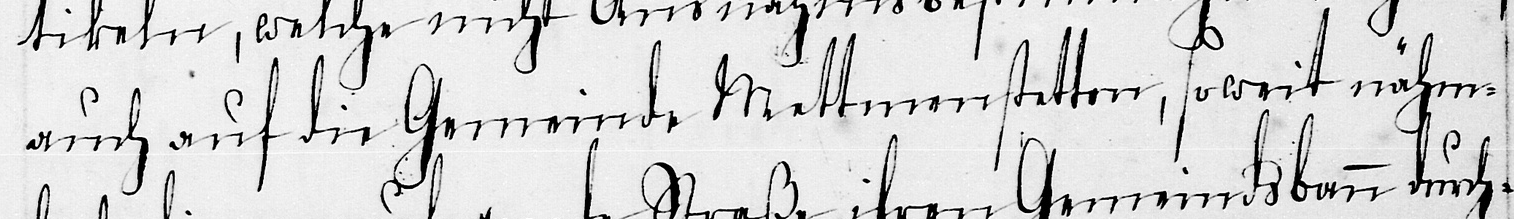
auch auf die Gemeinde Mettmenstetten, soweit nähm¬
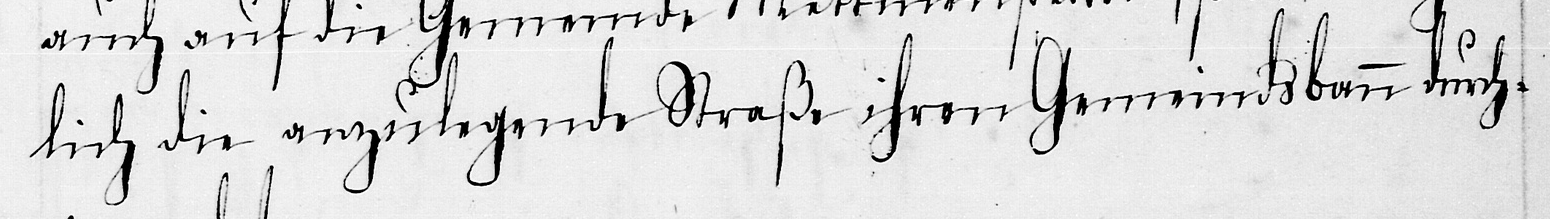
lich die anzulegende Straße ihren Gemeindsbann durch¬
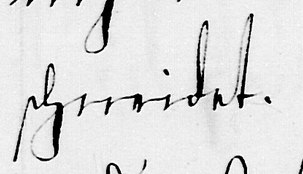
schneidet.
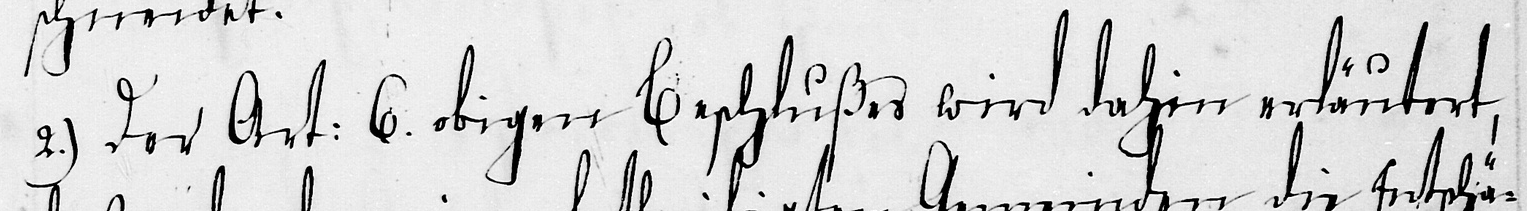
2.) Der Art: 6. obigen Beschlußes wird dahin erläutert,
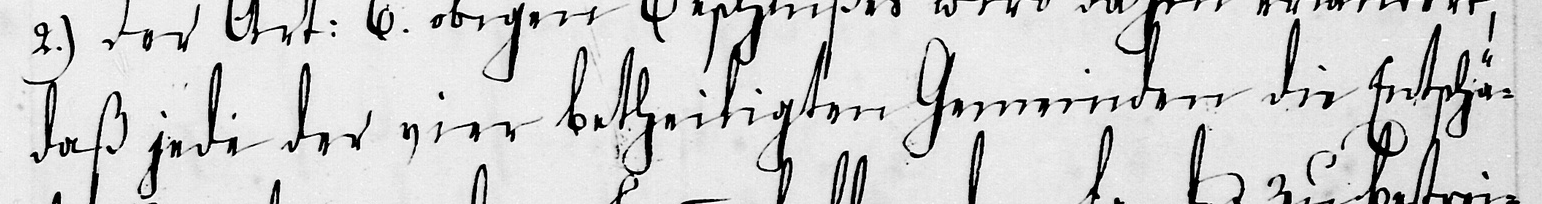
daß jede der vier betheiligten Gemeinden die Entschä¬
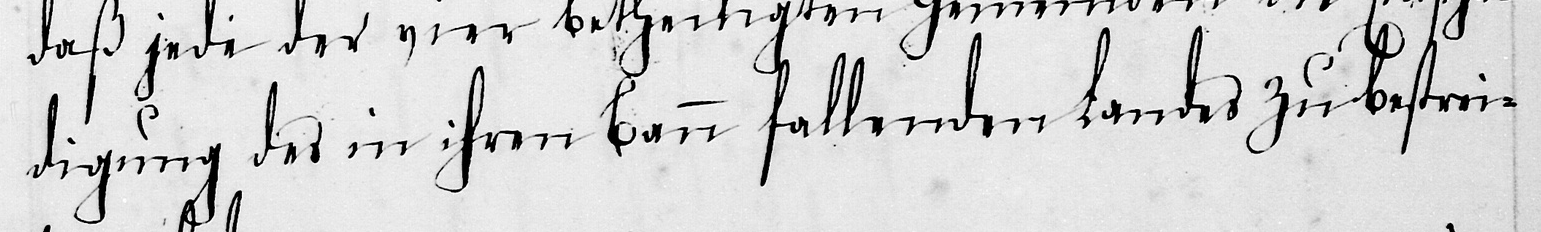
digung des in ihren Bann fallenden Landes zu bestrei¬
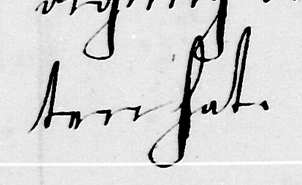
ten hat.
